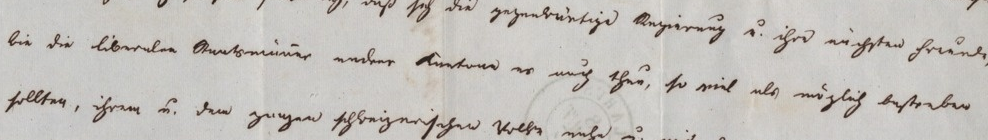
wie die liberalen Staatsmänner andrer Kantone es auch thun, so viel als möglich bestreben
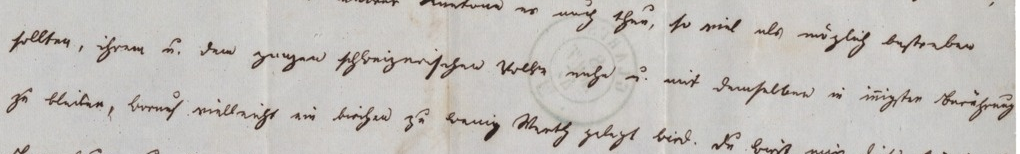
sollten, ihrem u. dem ganzen schweizerischen Volke nahe u. mit demselben in innigster Berührung
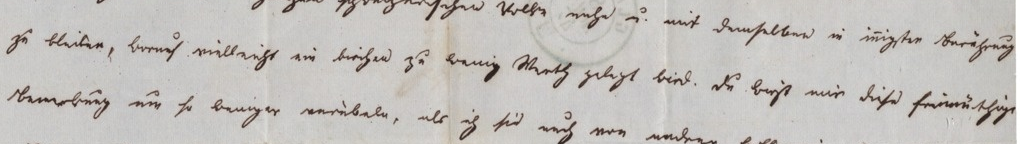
zu bleiben, worauf vielleicht ein bischen zu wenig Werth gelegt wird. Du wirst mir diese freimüthige
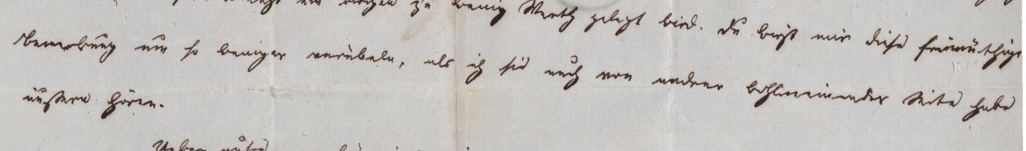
Bemerkung um so weniger verübeln, als ich sie auch von andrer wohlmeinender Seite habe
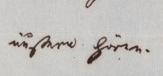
äußern hören.
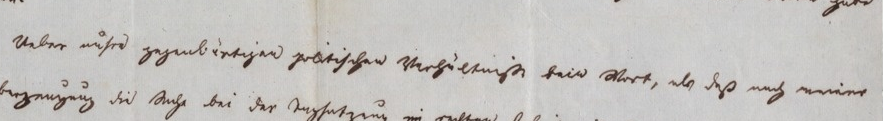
Ueber unsre gegenwärtigen politischen Verhältnisse kein Wort, als daß nach meiner
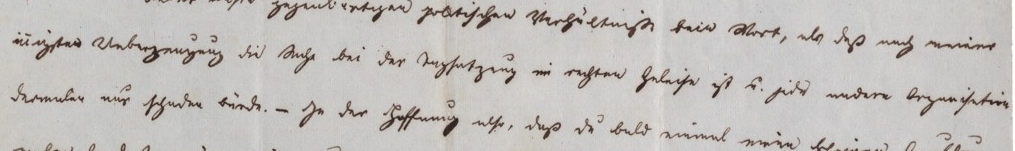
innigsten Ueberzeugung die Sache bei der Tagsatzung im rechten Geleise ist u. jede andere Organisation
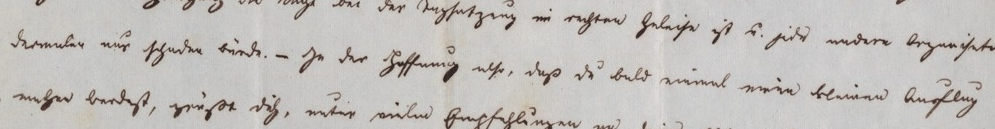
dermalen nur schaden würde. – In der Hoffnung also, daß Du bald einmal einen kleinen Ausflug
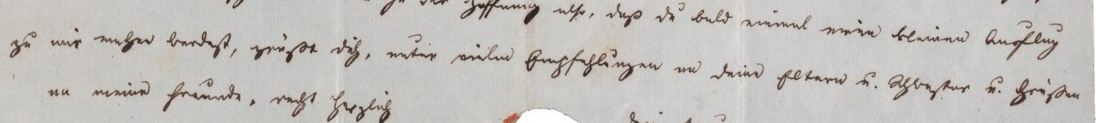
zu mir machen werdest, grüßt Dich, unter vielen Empfehlungen an Deine Eltern u. Schwester u. Grüßen
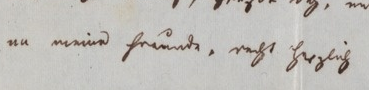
an meine Freunde, recht herzlich
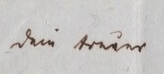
Dein treuer
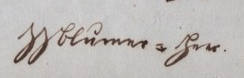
J J Blumer-Heer.
